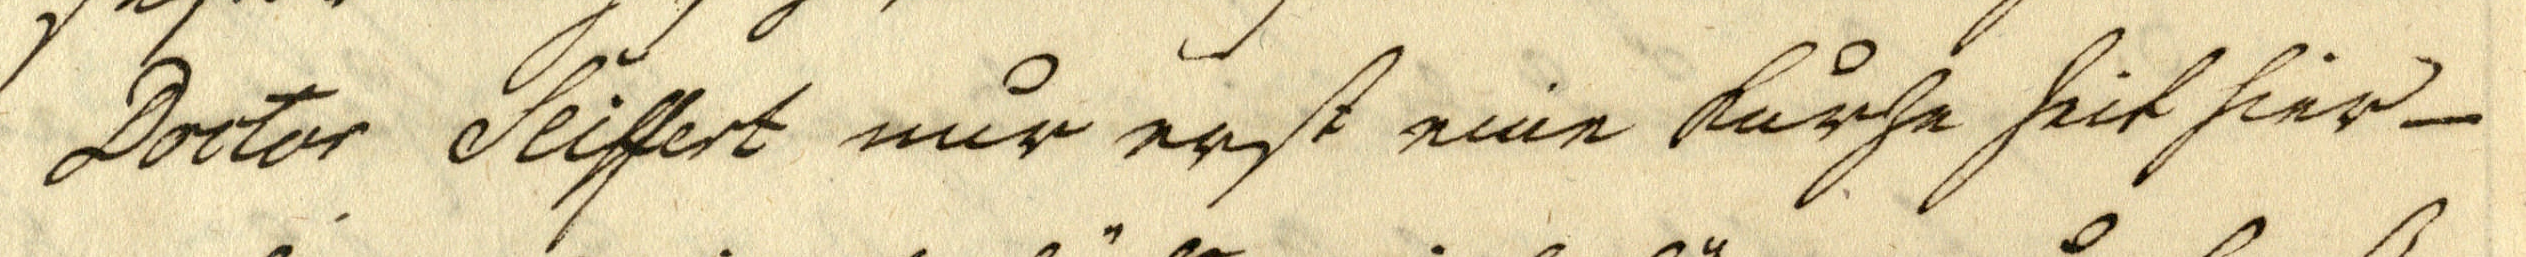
Doctor Seiffert nur erst eine kurze Zeit hier -
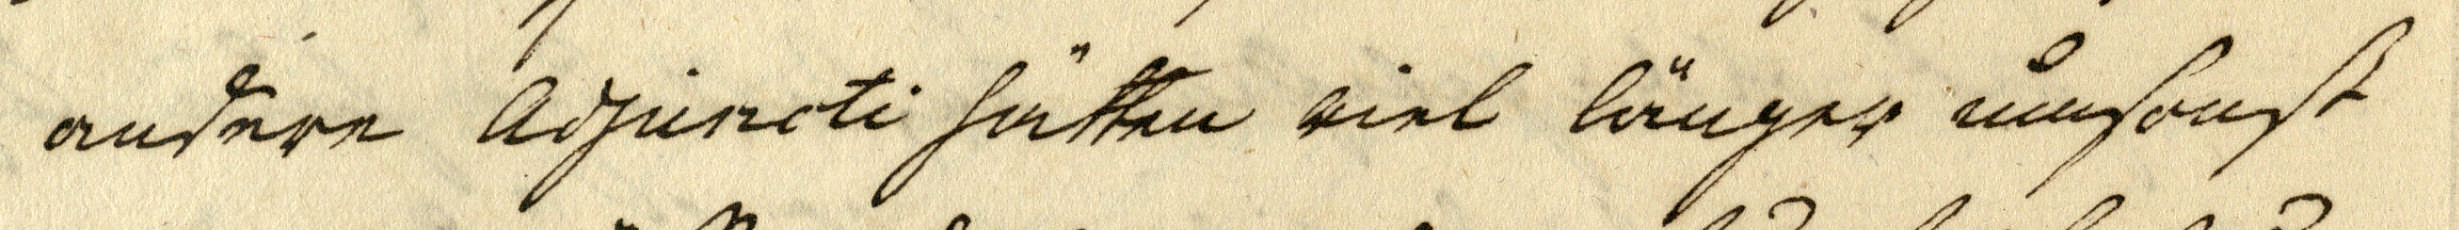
andere Adjumcti hätten viel länger umsonst
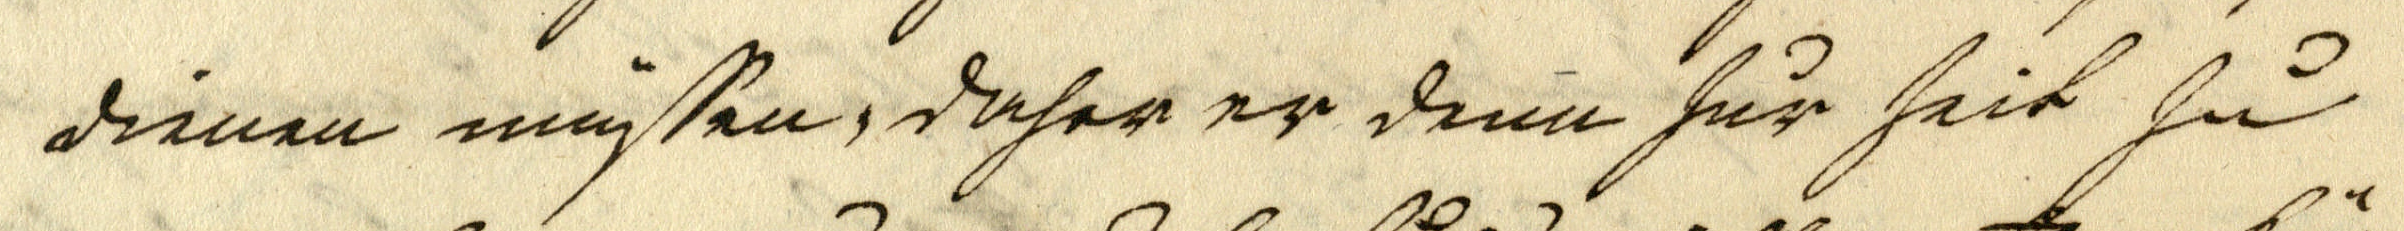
dienen müssen, daher er denn zur Zeit zu
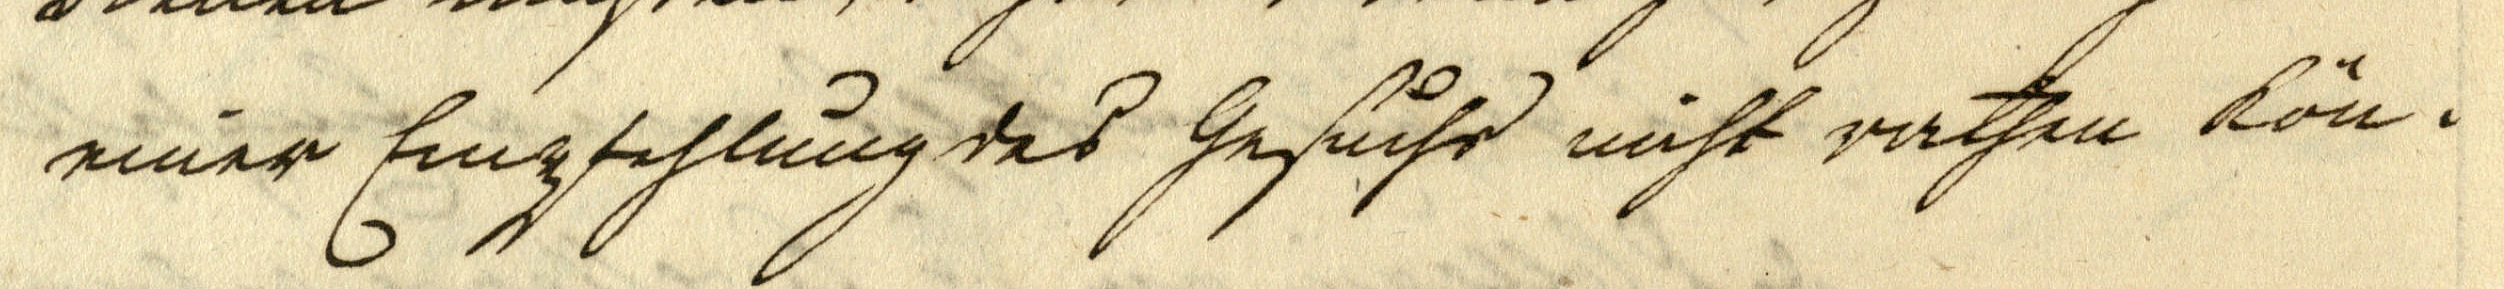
einer Empfehlung des Gesuchs nicht rathen kön-
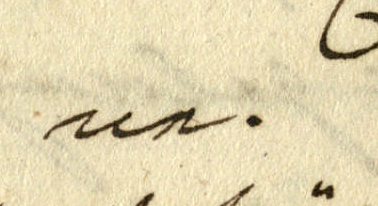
ne.
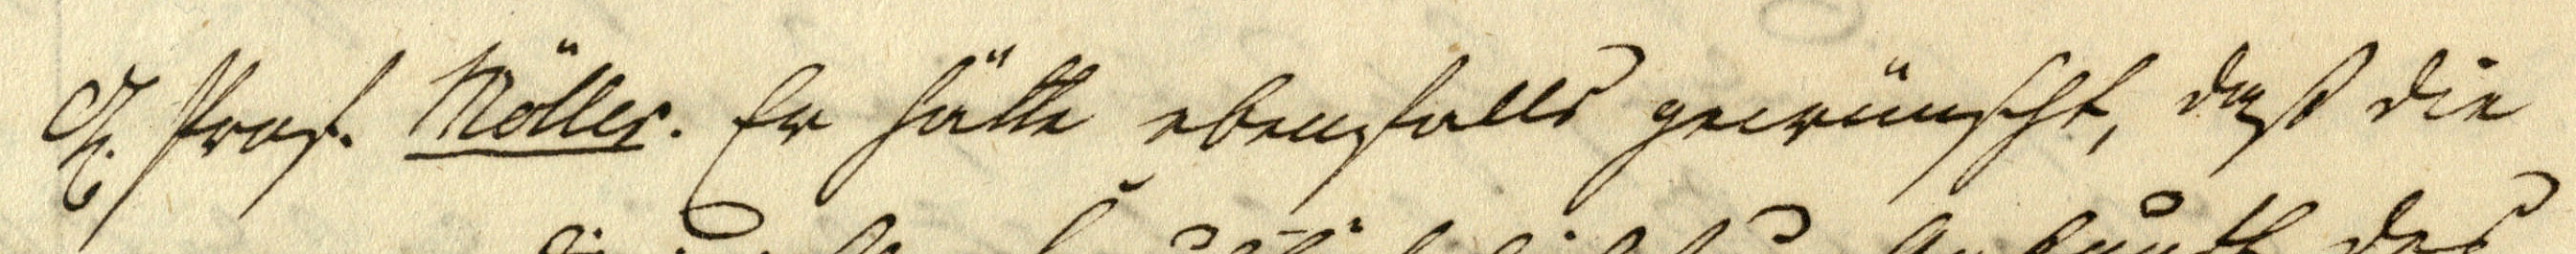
dh. Prof. Möller. Er hätte ebenfalls gewünscht, daß die
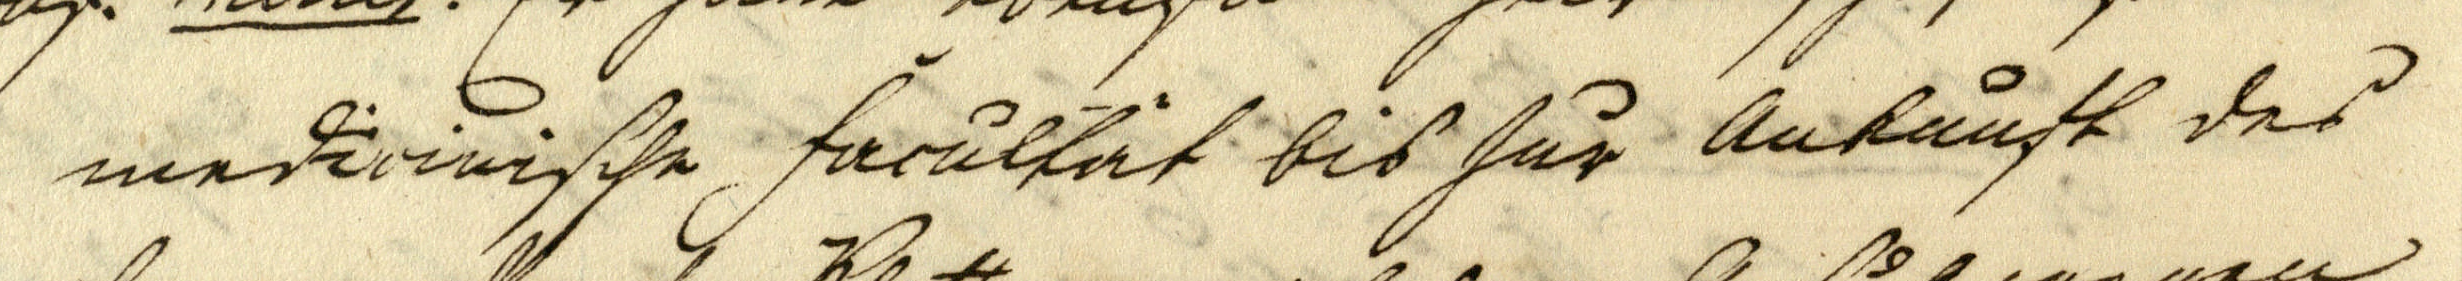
medicinische Facultät bis zur Ankunft des
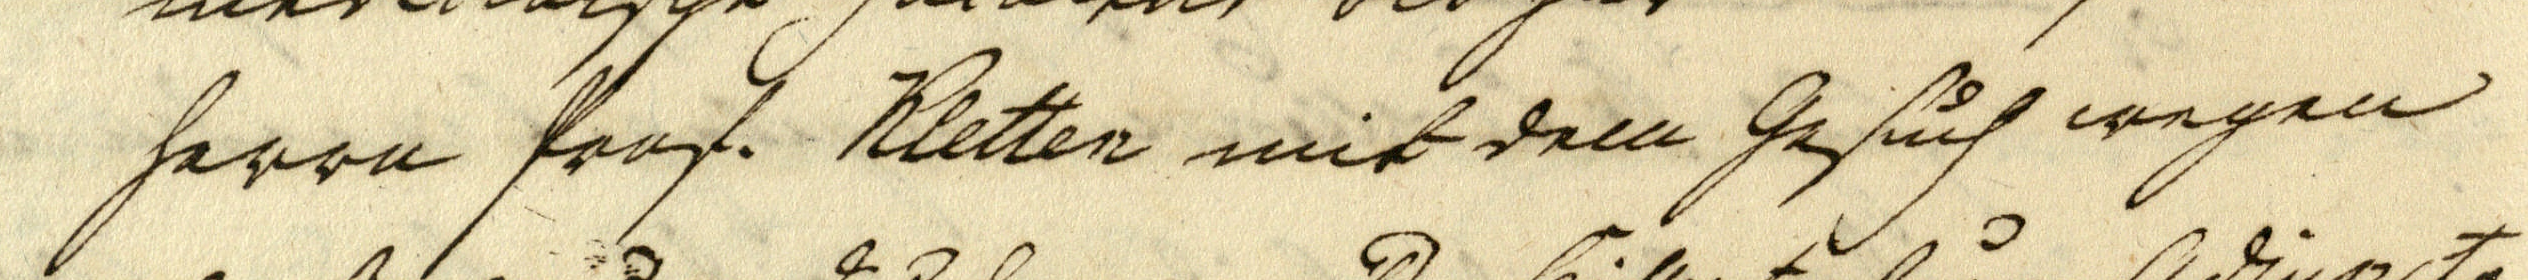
herrn Prof. Kletten mit dem Gesuch wegen
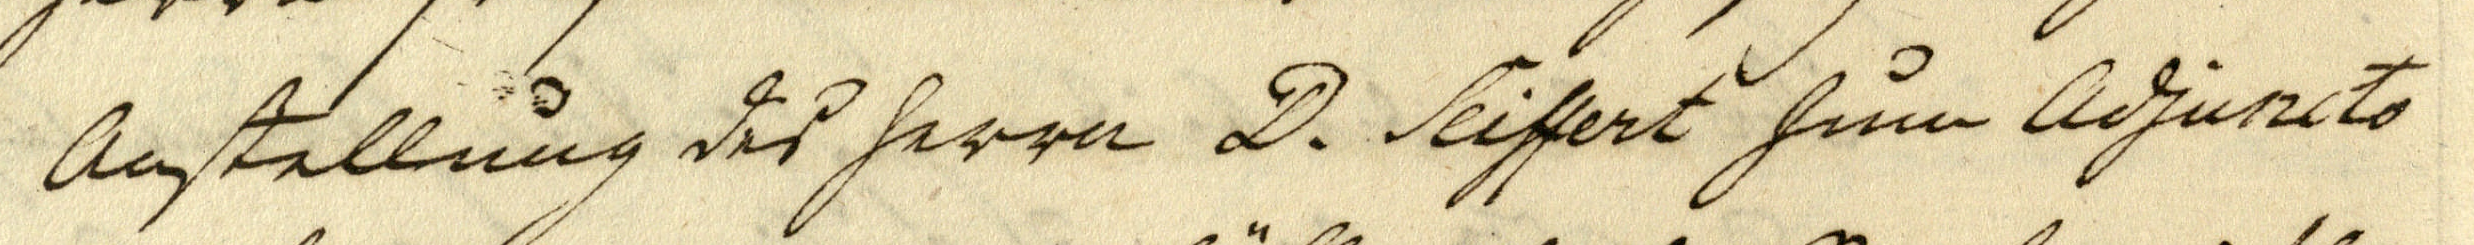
Anstellung des herrn D. Seiffert zum Adjuncto
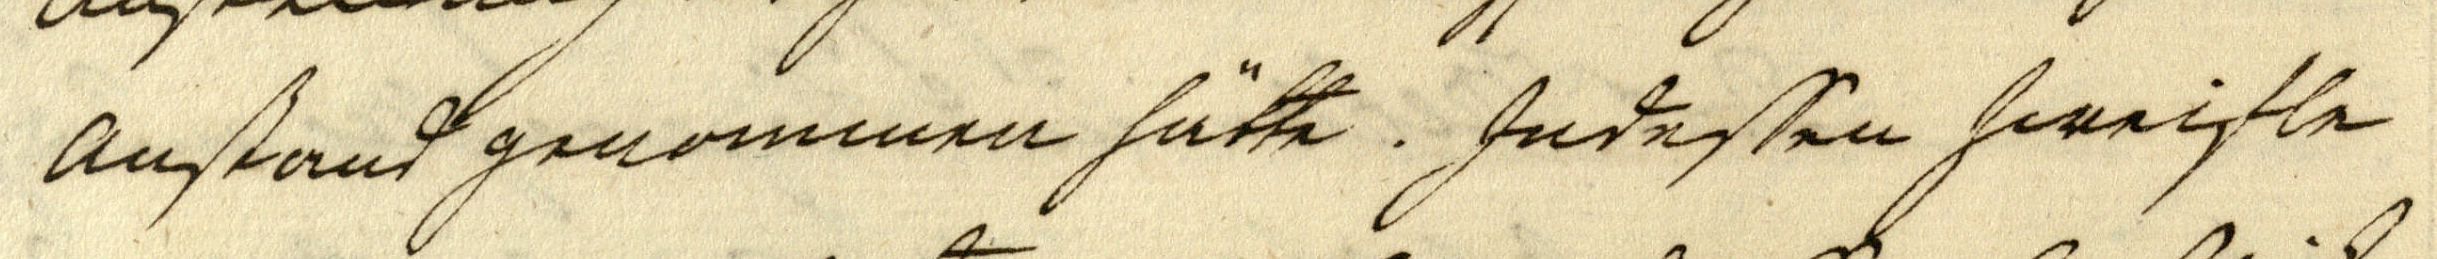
Anstand genommen hätte. Indessen zweifle
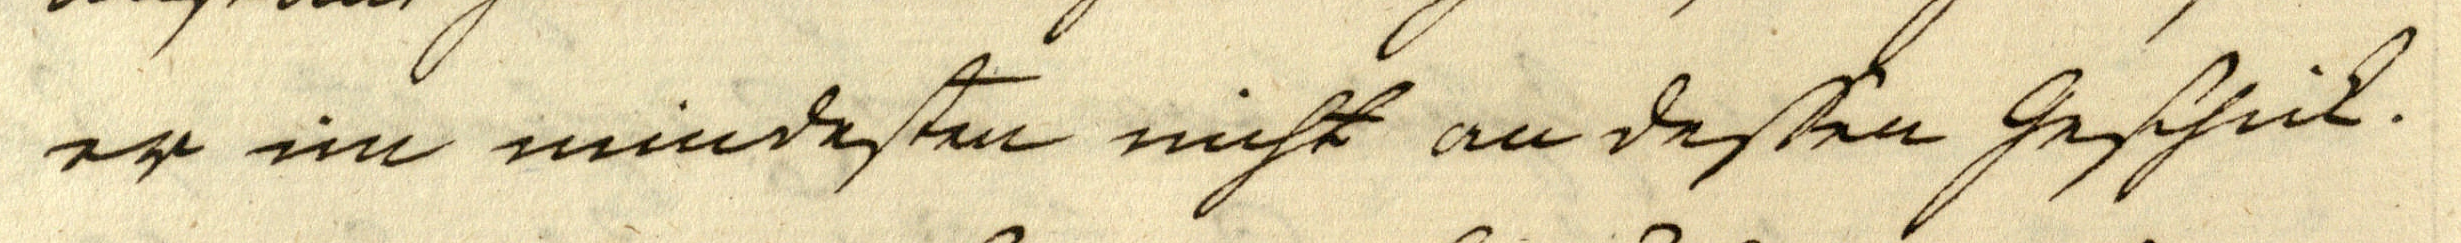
er im mindesten nicht an dessen Geschick-
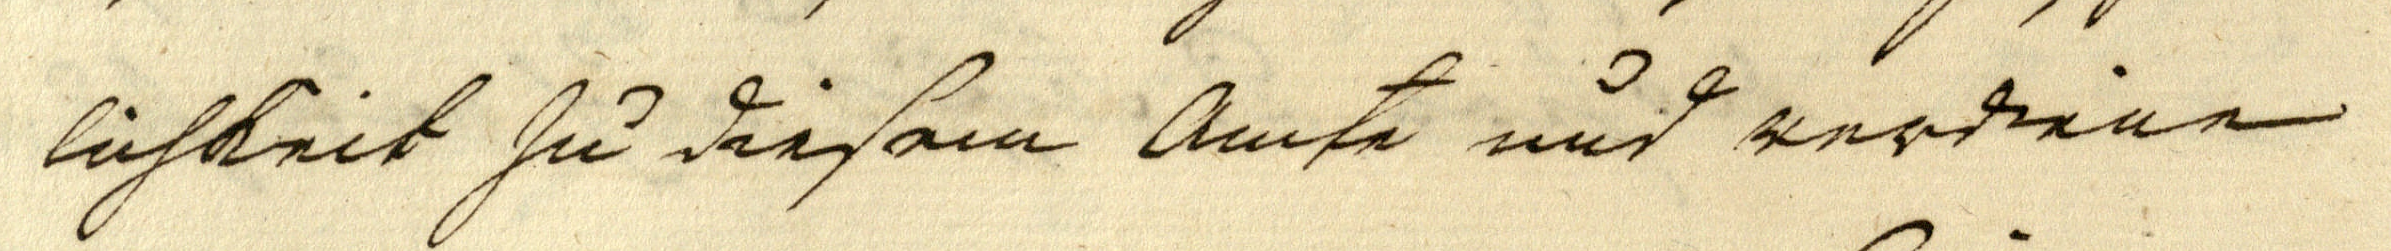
lichkeit zu diesem Amte und verdiene
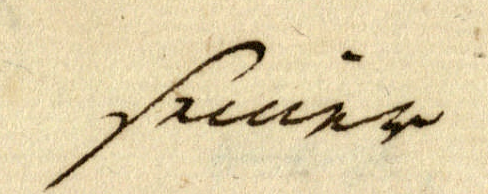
seiner
